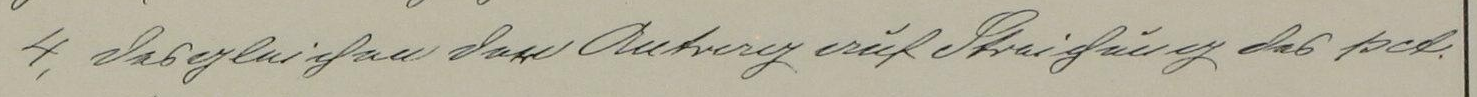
4. desgleichen der Antrag auf Streichung des pct.
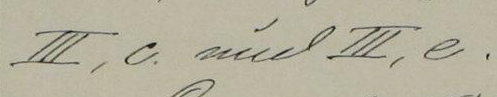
III,c und III,e.
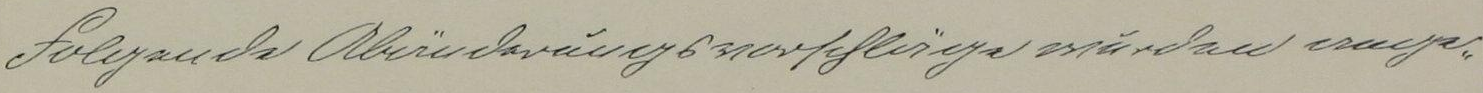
Folgende Abänderungsvorschläge wurden ange-
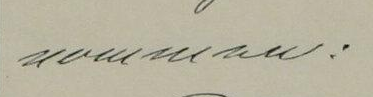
nommen:
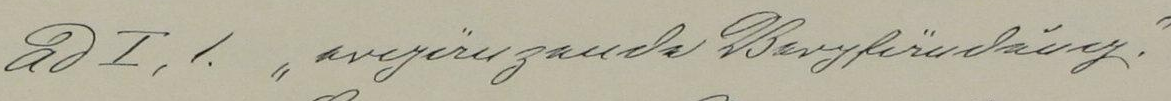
ad I,1. „ergänzende Verpfändung“.
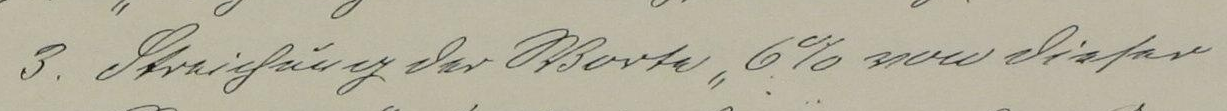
3. Streichung der Worte „6% von dieser
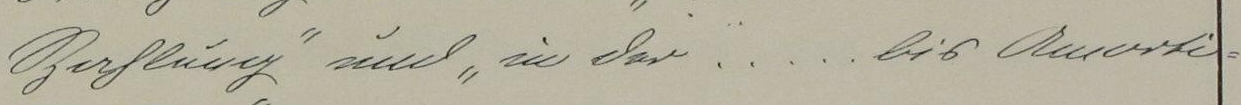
Zahlung“ und „in der ..... bis Amorti-
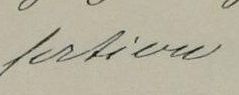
sation“
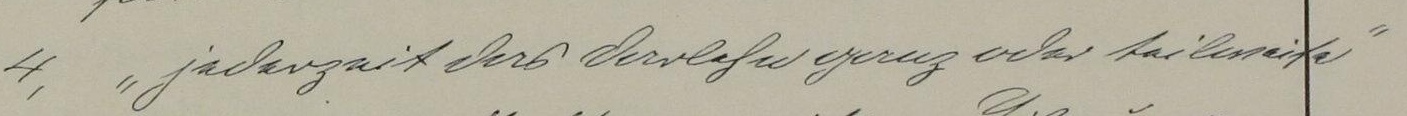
4. „jederzeit das Darlehn ganz oder teilweise“
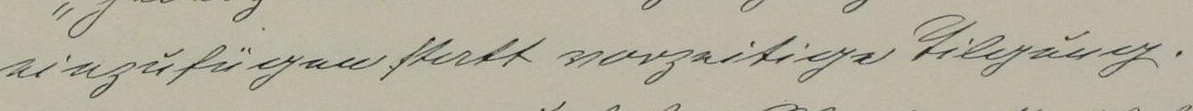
einzufügen statt vorzeitige Tilgung.
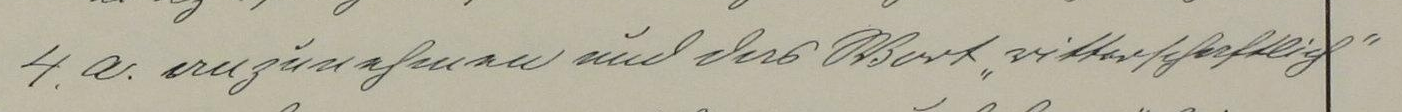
4.a. anzunehmen und das Wort „ritterschaftlich“
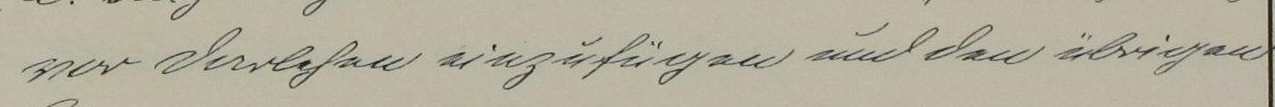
vor Darlehen einzufügen und den übrigen
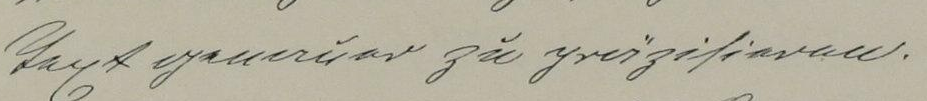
Text genauer zu präzisieren.
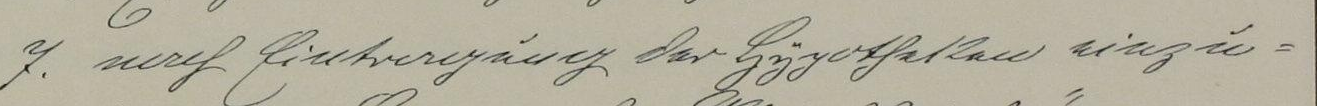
7. nach Eintragung der Hypotheken einzu-
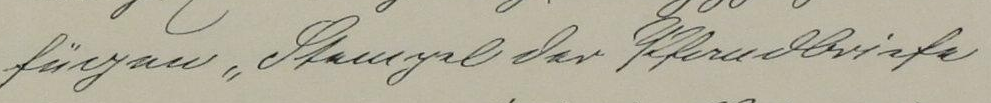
fügen „Stempel der Pfandbriefe“
